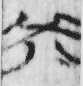癸
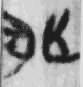卯
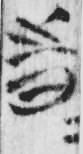之日
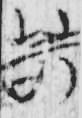苛
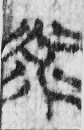光
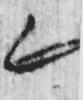㠯（以）
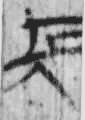長
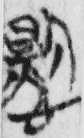惻
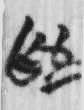爲
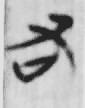右〈左〉
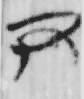尹
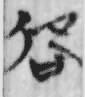卲
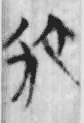{力它}
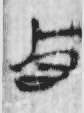貞
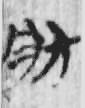○（病）
